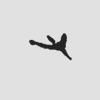又
